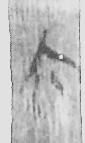六
